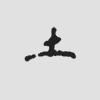土
